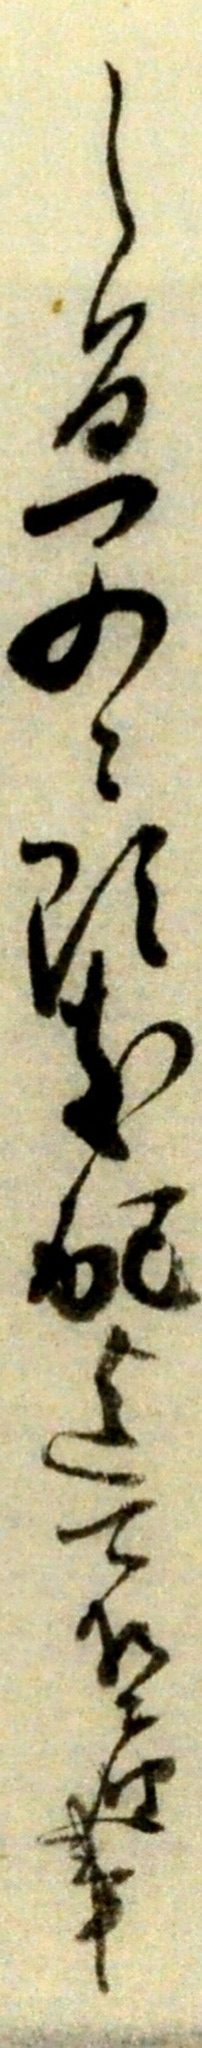候間早々頭支配迄可被届事
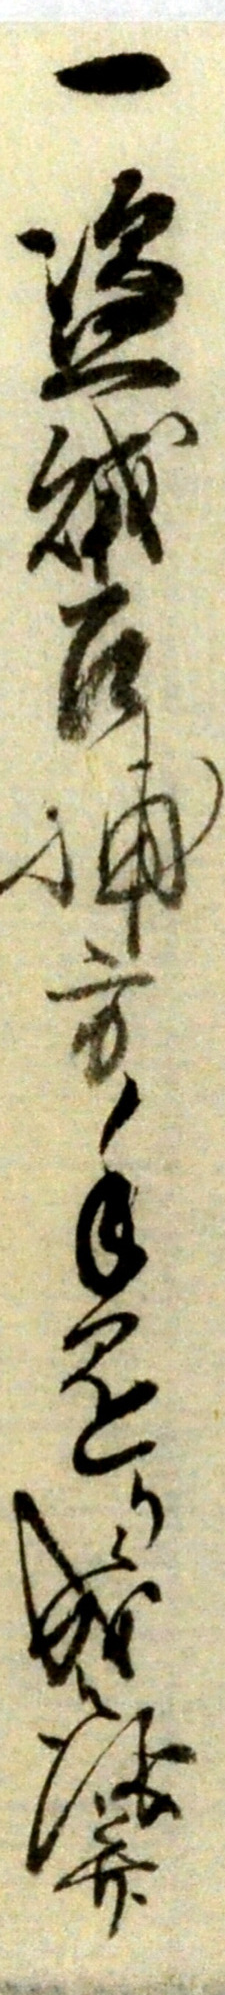一盗賊召捕方手懸りに成候儀幷
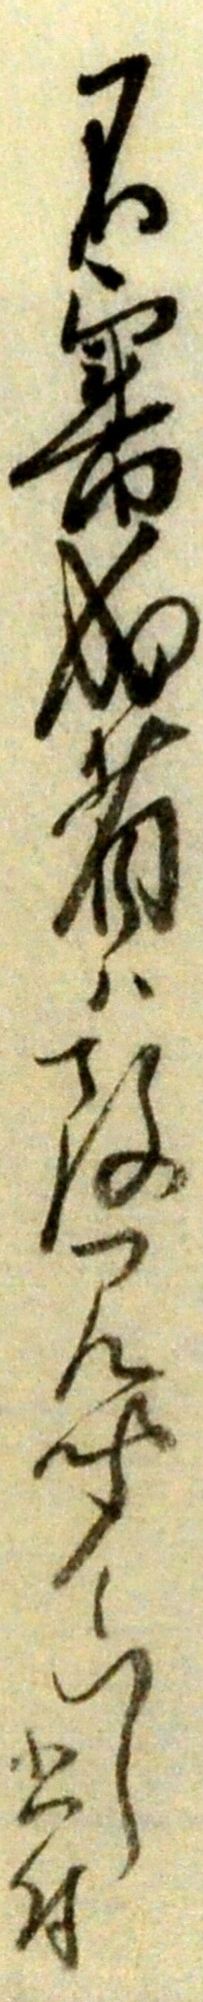不審成者は改見聞候はゝ書付
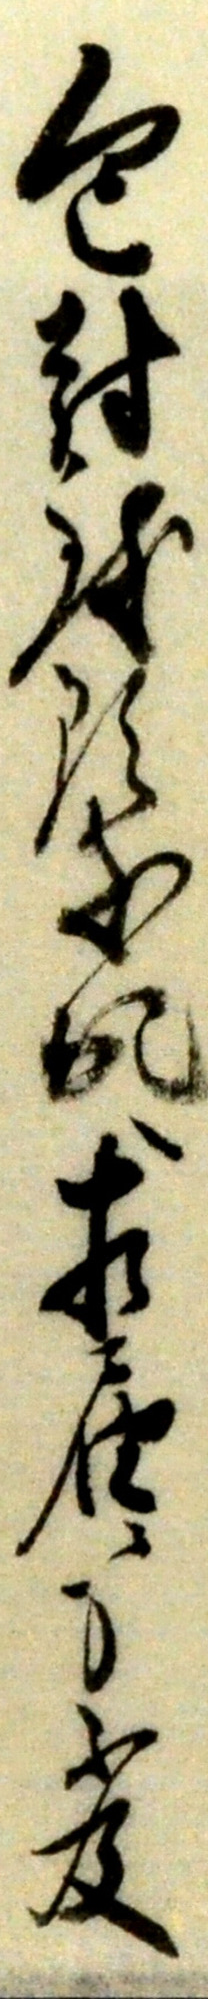包封致頭支配へ相届にも不及
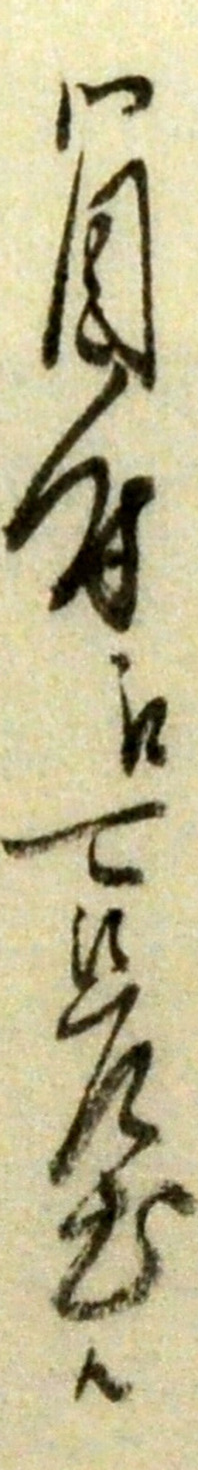御目付え可差出候

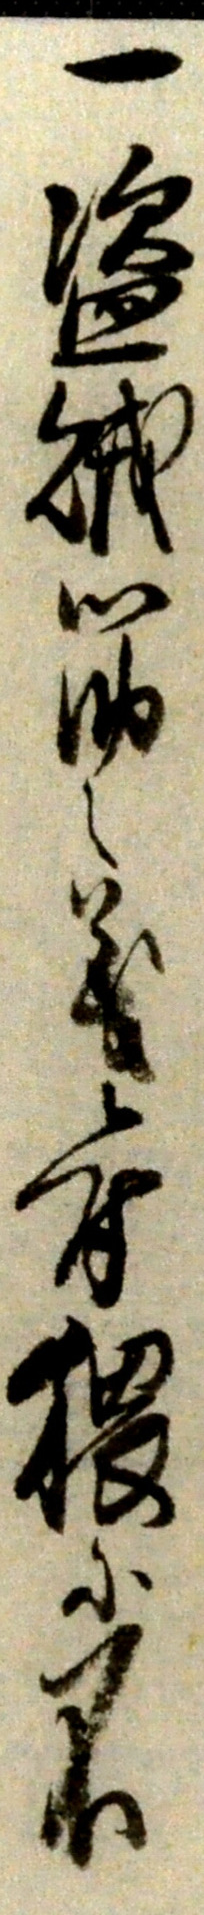一盗賊筋之義に付猥に不
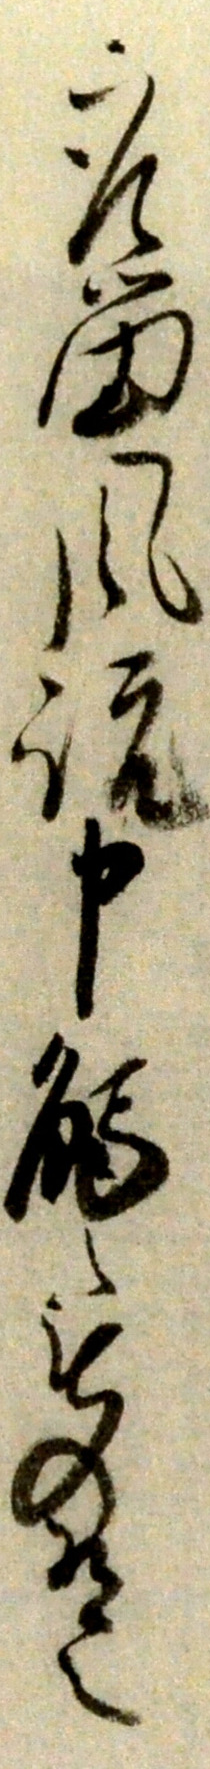取留風説申触候もの有之
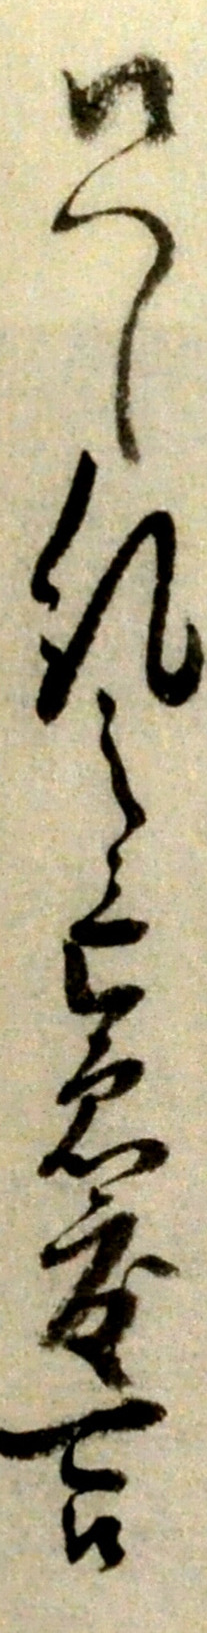候はゝ糺之上急度可被
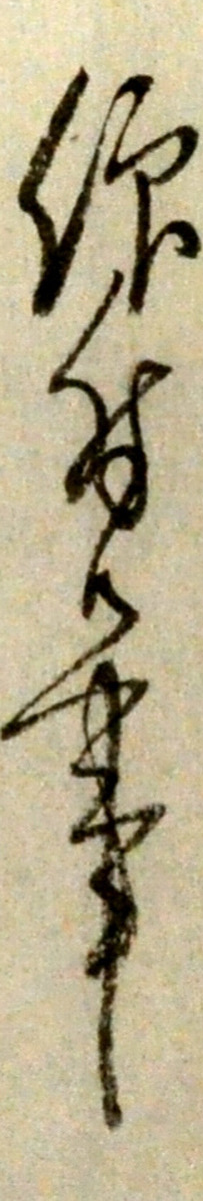仰出候事
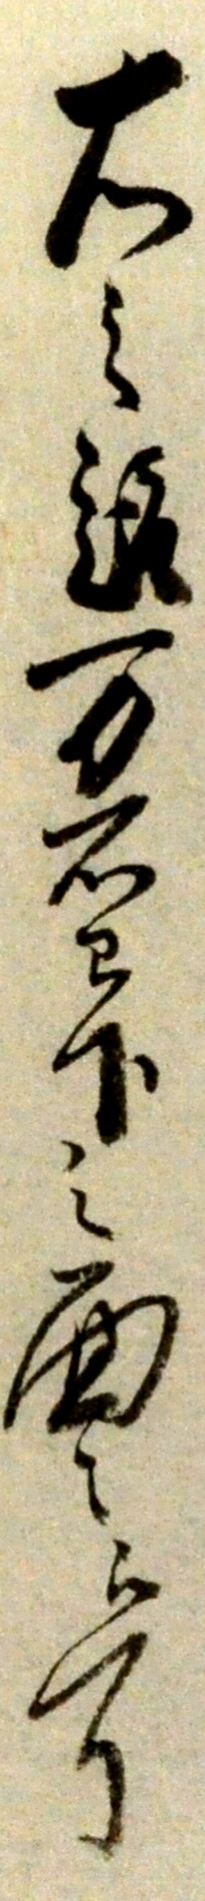右の趣万石已下之面々え可
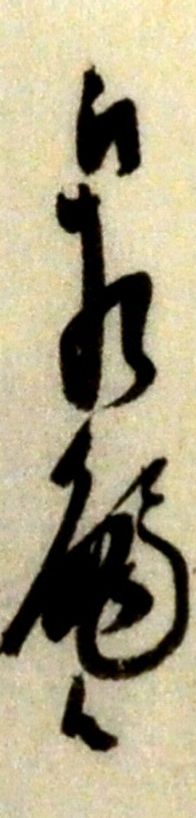被相触候
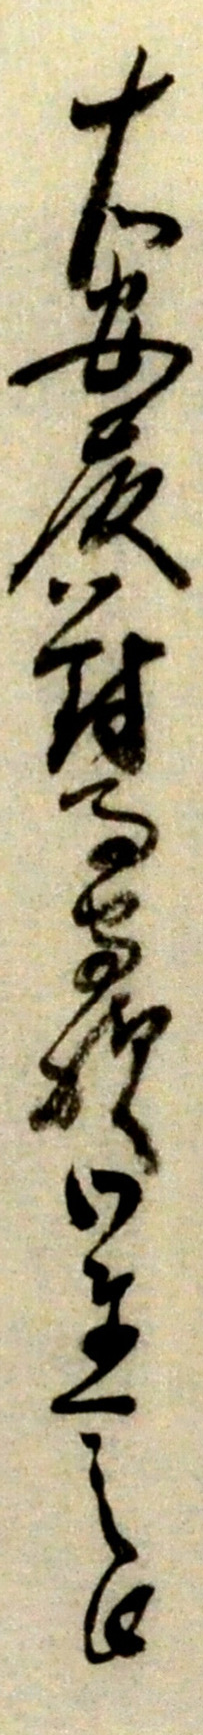右安藤対馬守様御達之由
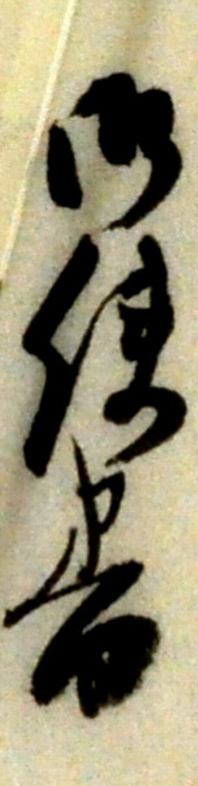御使番
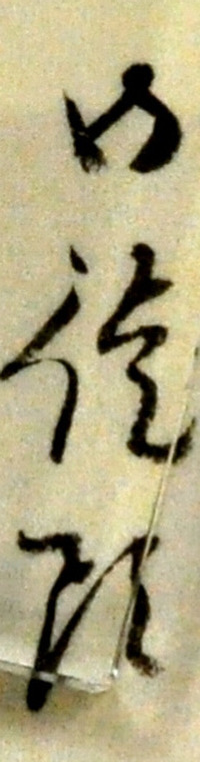御徒頭
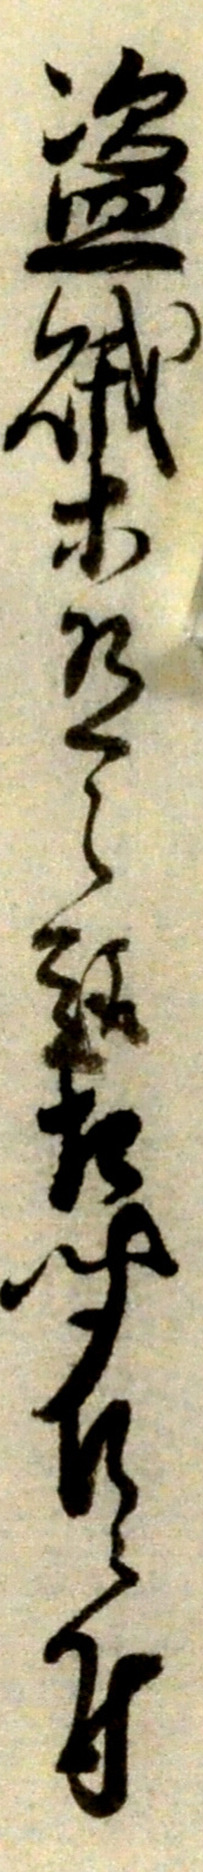盗賊等有之趣相聞候に付
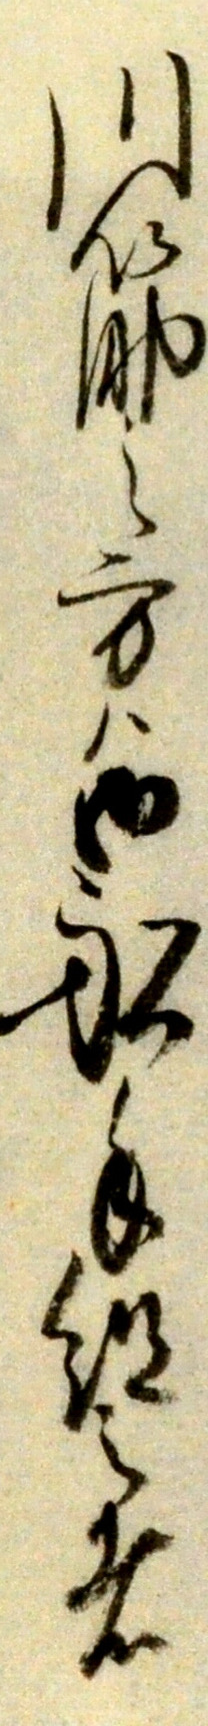川筋之方は御船手組之者
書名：申合帳〔一括〕
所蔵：伊那市立高遠町図書館・合同会社AMANE
